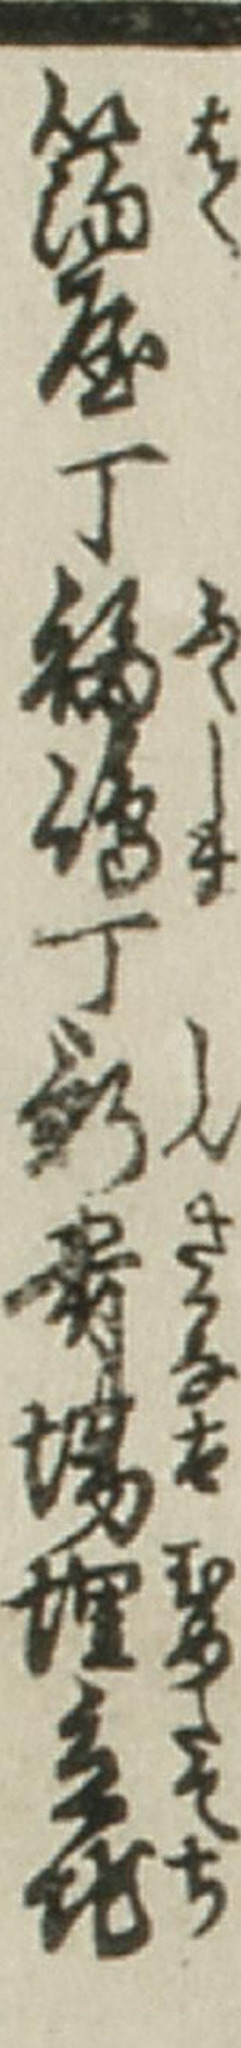箔屋丁福嶋丁新肴場埋立地
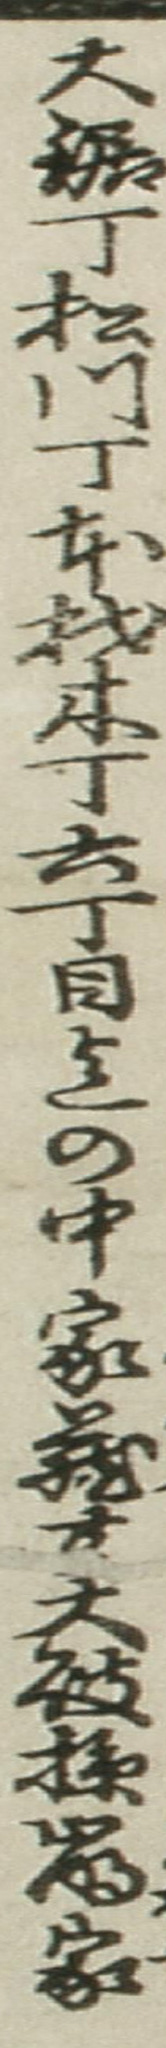大鋸丁松川丁本材木丁六丁目迄の中家蔵共大破損崩家
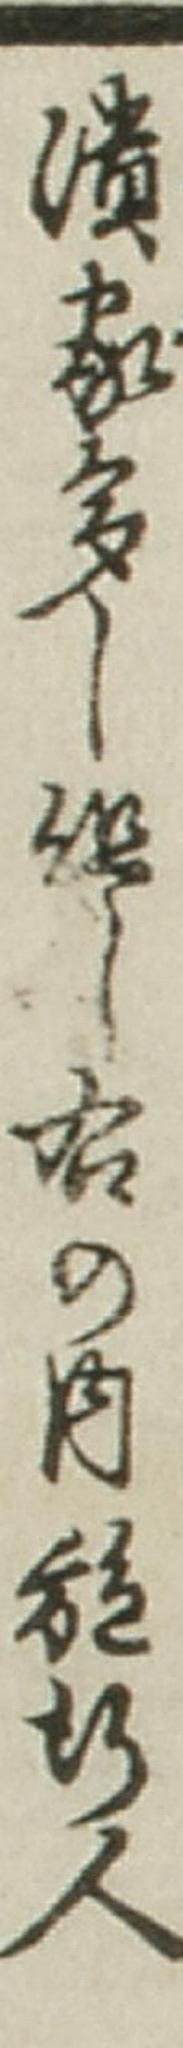潰家多し但し右の内施行人
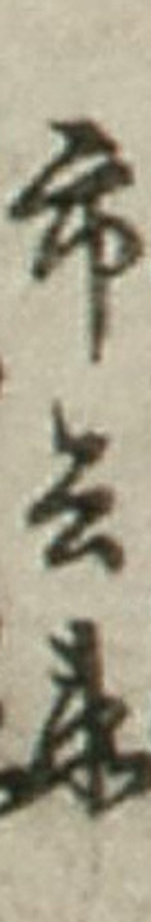市兵衛
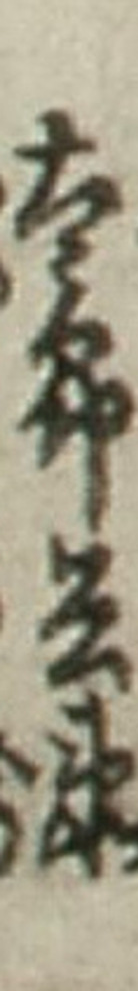太郎兵衛
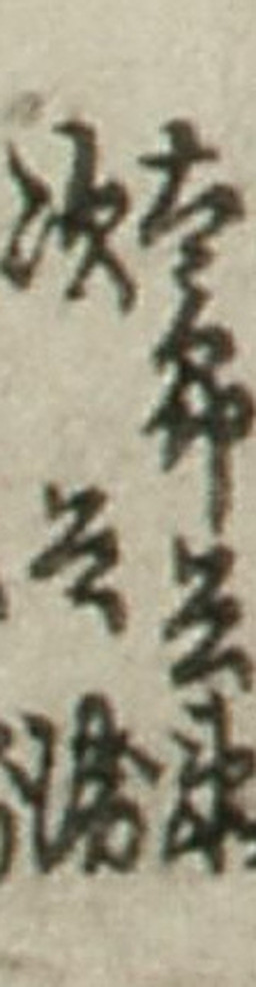次兵衛
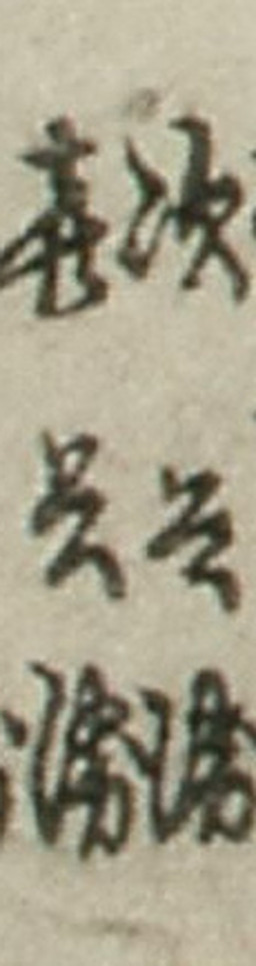喜兵衛
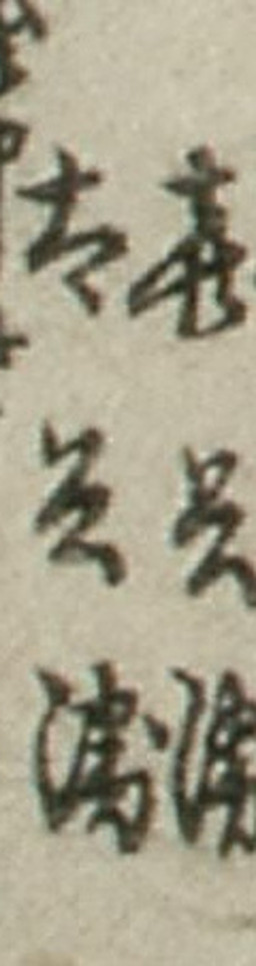太兵衛
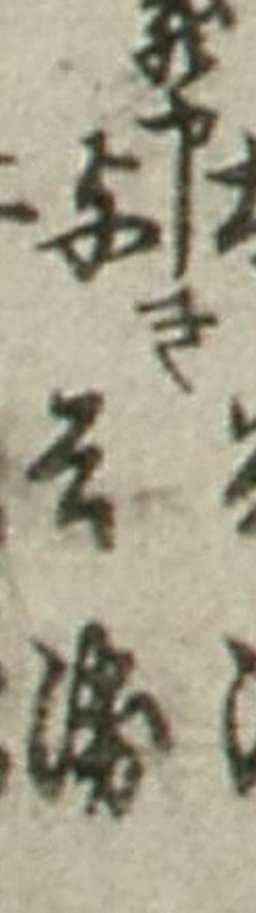与兵衛
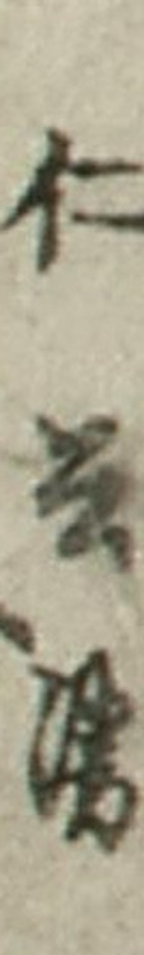仁兵衛
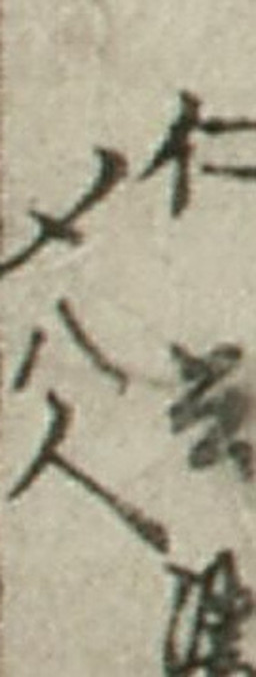〆八人

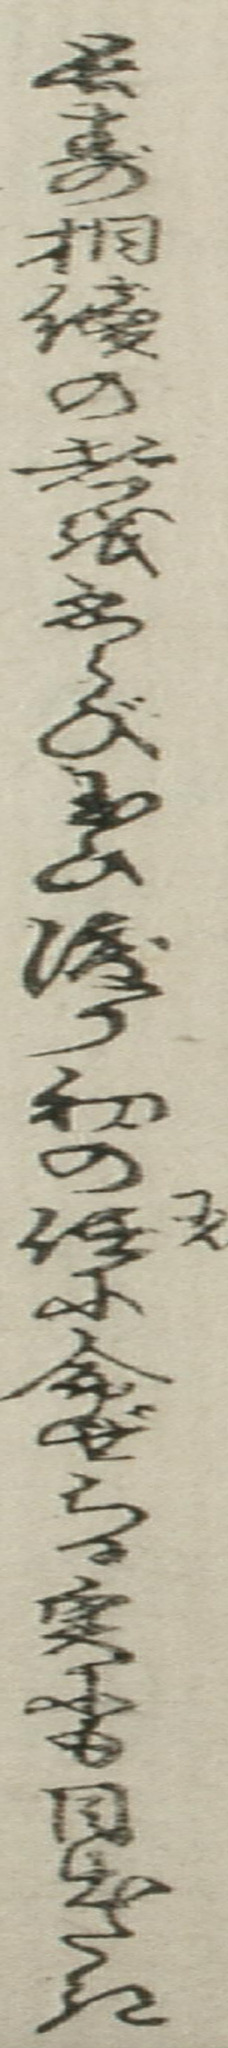長寿相続の者をゑらび玉ひ渡り初の任にんに命ぜらる実にも目出たき
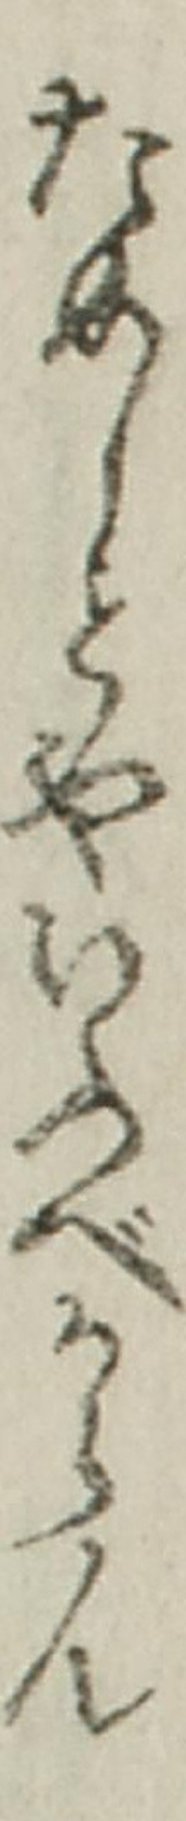ためしとやいうべからん
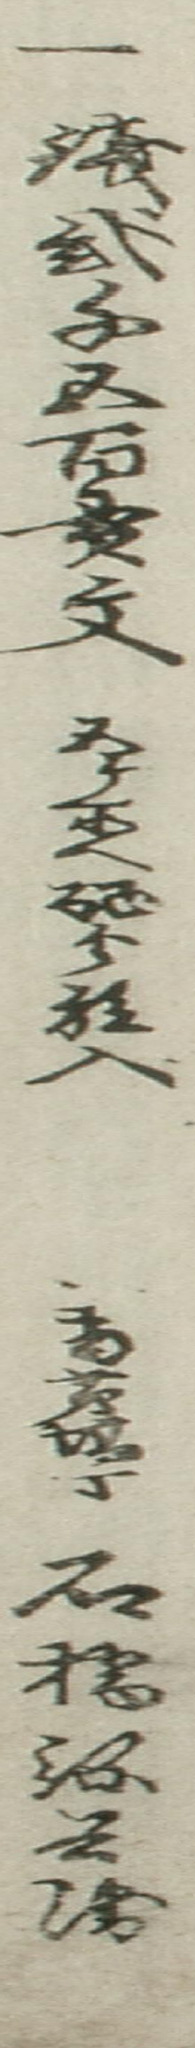一銭弐千五百貫文五ケ所へ配分預入南茅場丁石橋弥兵衛
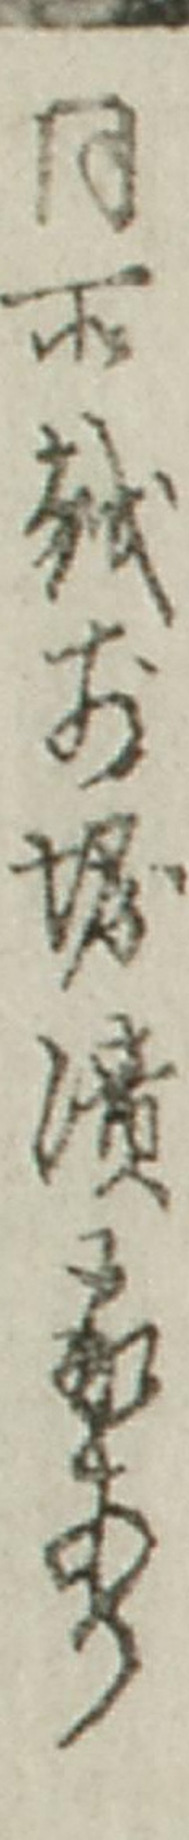同所越前堀潰家あり

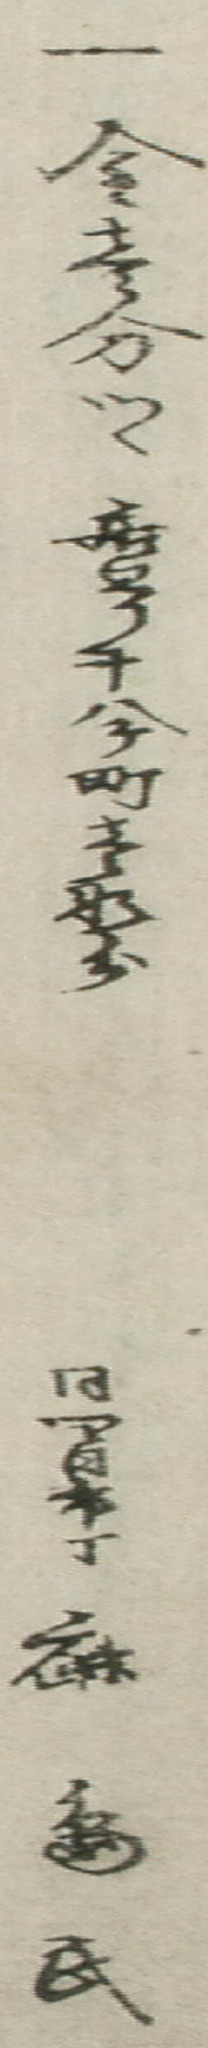一金壱分ツゝ居廻り十八ケ町壱軒分同四日市丁麻島氏
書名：安政見聞誌　上
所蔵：東京大学地震研究所図書室 Earthquake Research Institute Library, The University of Tokyo, JAPAN
